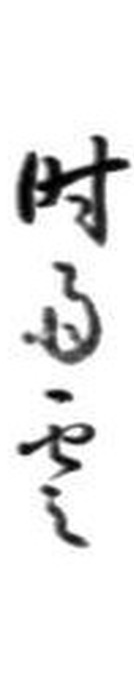時雨雲
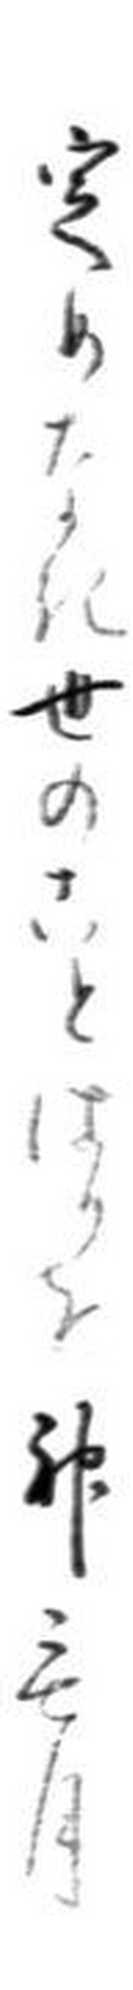定めなき世のことはりを神無月
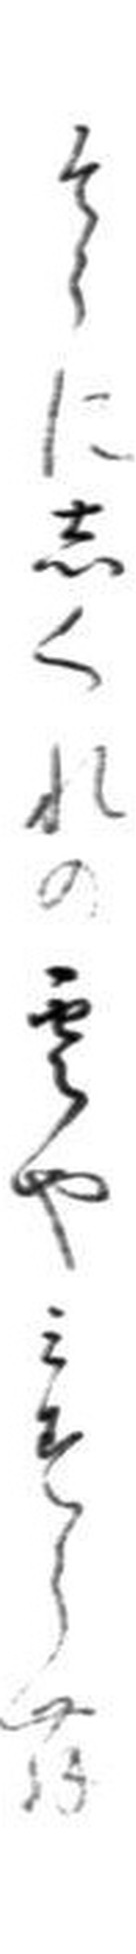そらにしくれの雲やみすらむ
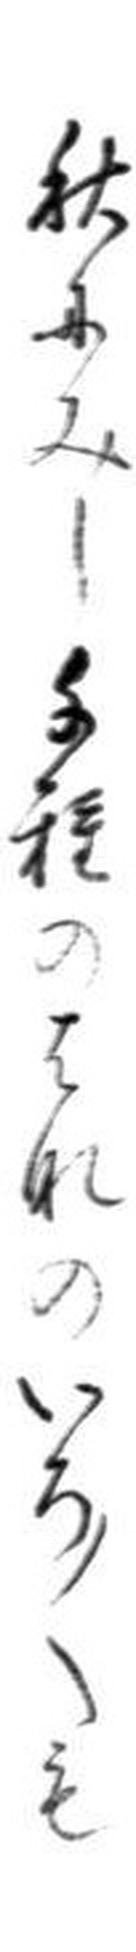秋にみし千種のはなのいろ〳〵も
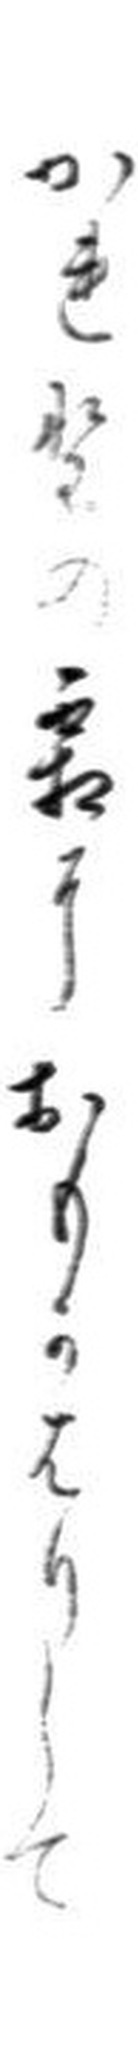かれ野の霜におもかはりして

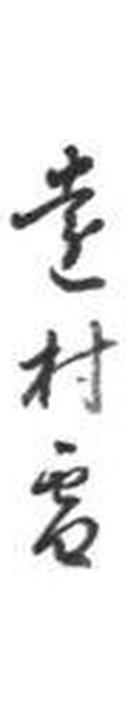遠村雪
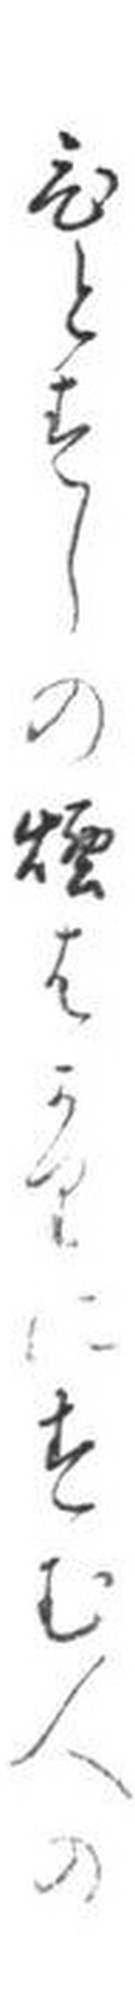ひとすしの煙はかりにすむ人の
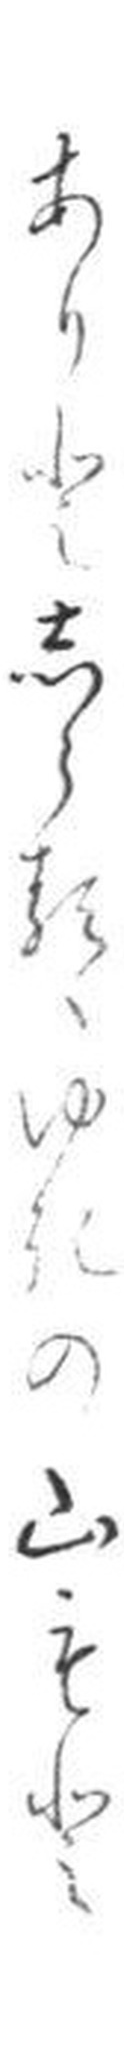ありとしらるゝゆきの山もと
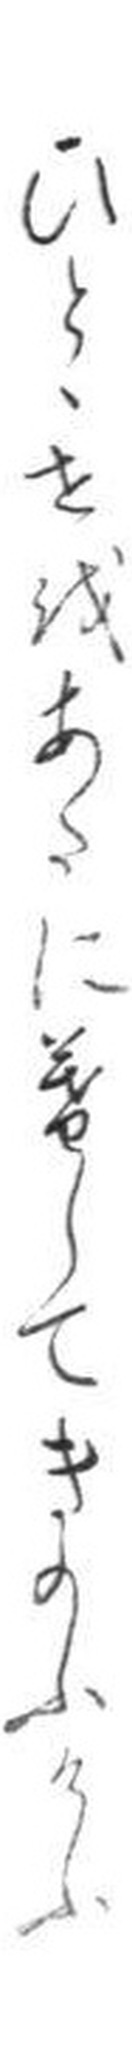ひとゝせをあたに暮してきのふけふ
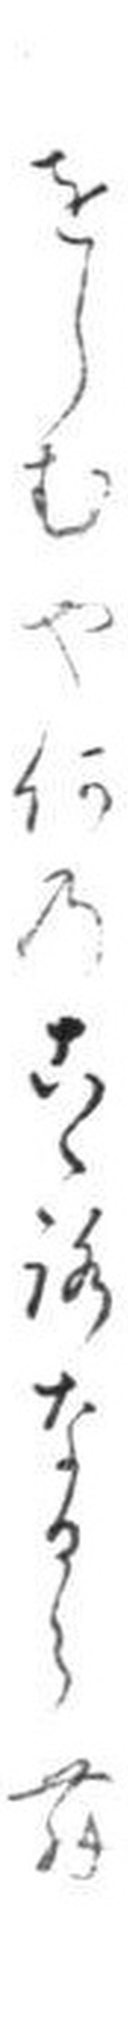をしむや何のこゝろなるらむ
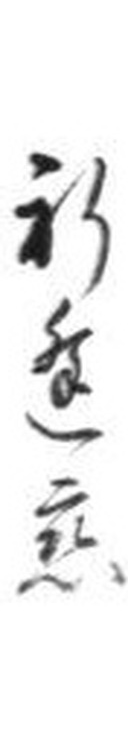祈逢恋
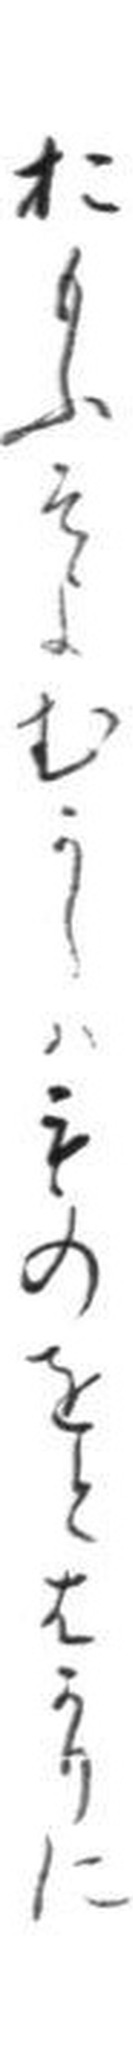おもふそよむかしはものをとはかりに
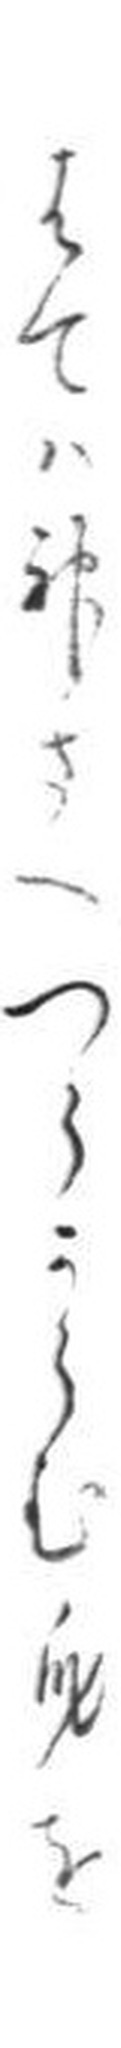はては神さへつらからむ身を
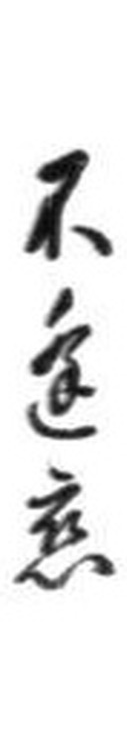不逢恋
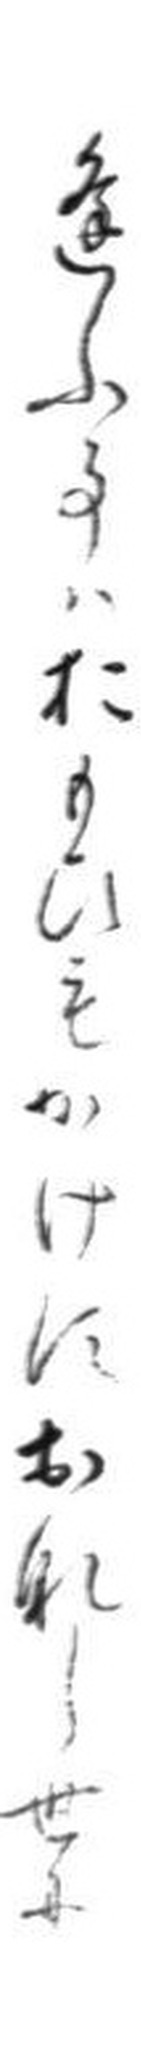逢ふ事はおもひもかけすおなし世に
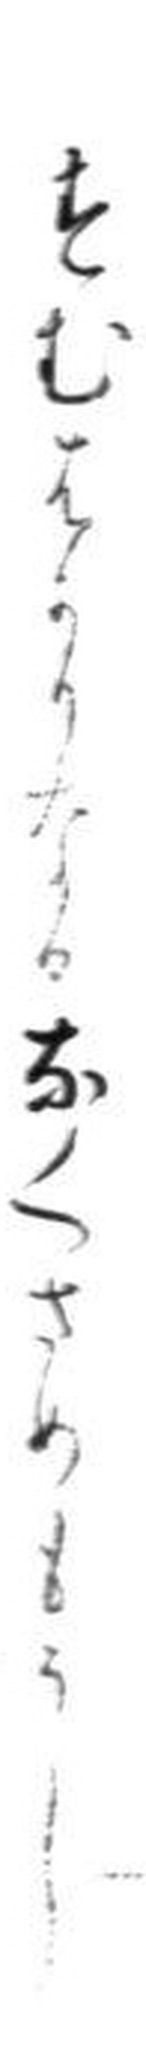すむはかりなるなくさめもうし
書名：家譜 八 光通公 従寛文十年到同十二年
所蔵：福井県文書館 Fukui Prefectural Archives
